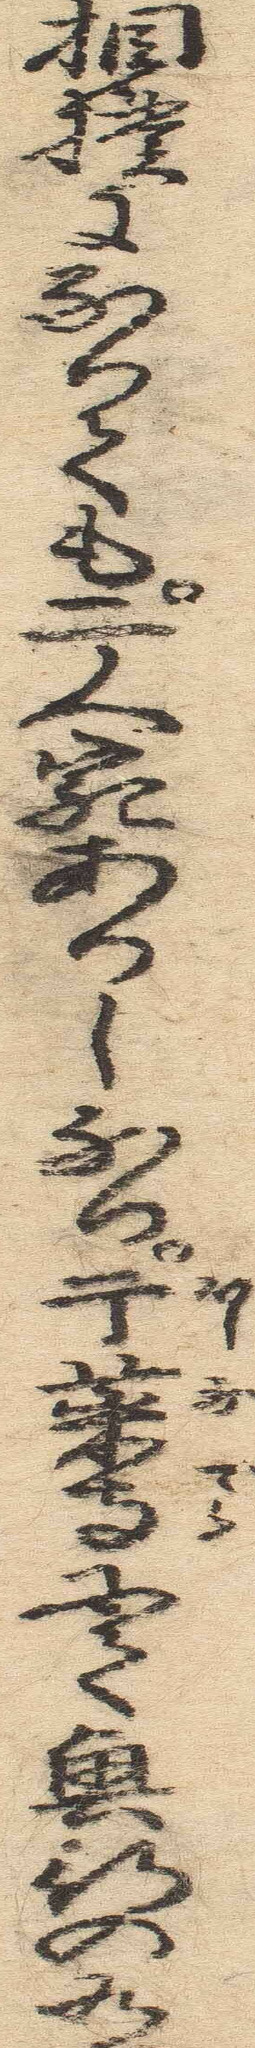相撲になりても。二人宛ありしなり。干菜寺にて興行の有
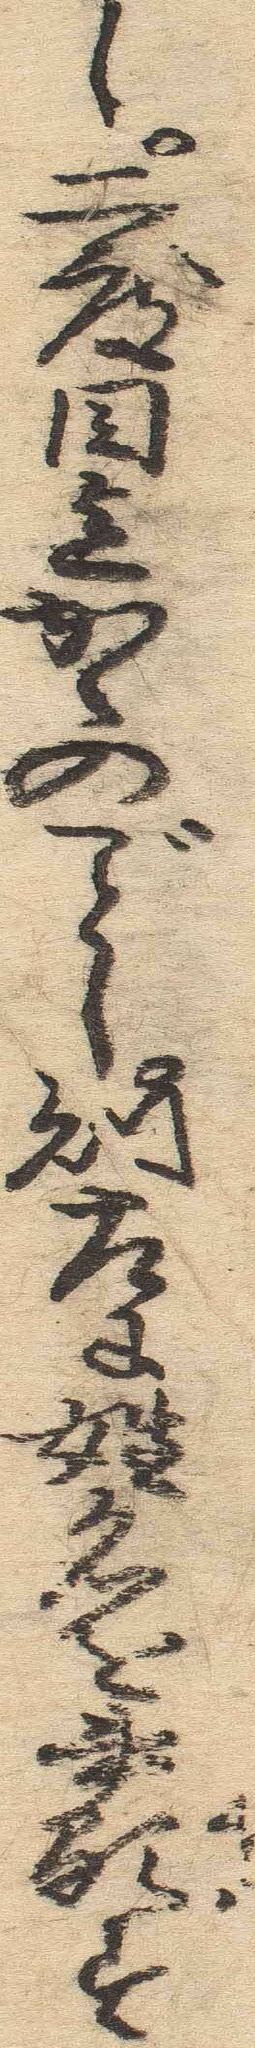し。二度目迄かくのごとし。則左に姓名を書顕す

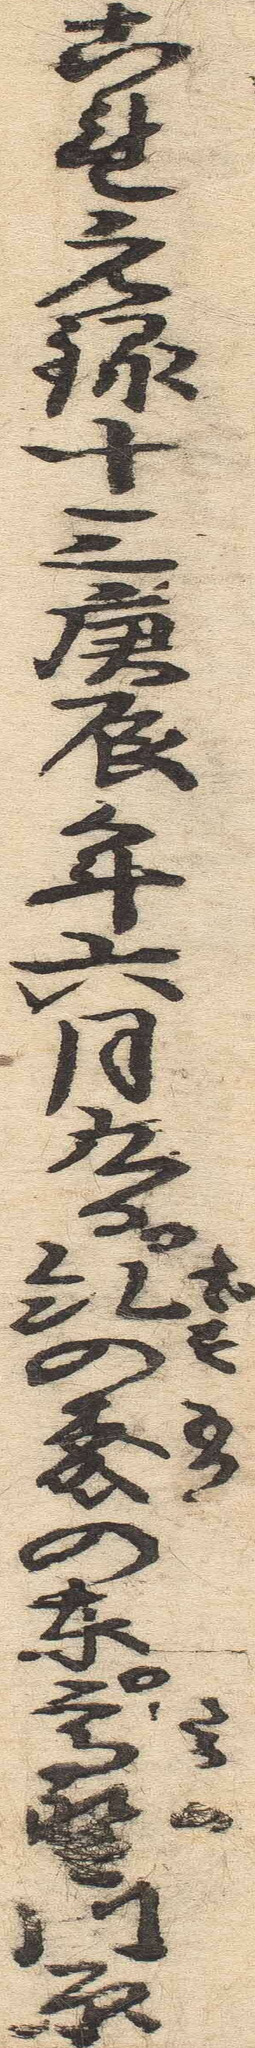これ元禄十三庚辰年六月九日。糺の森の東。高野川原
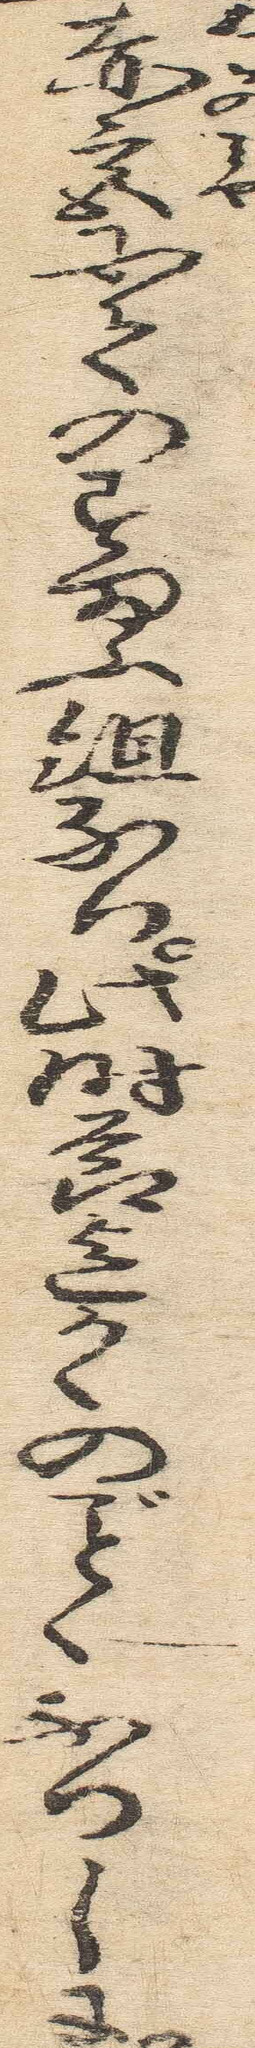赤宮にてのすまふ組なり。此時節迄かくのごとくなりしに。
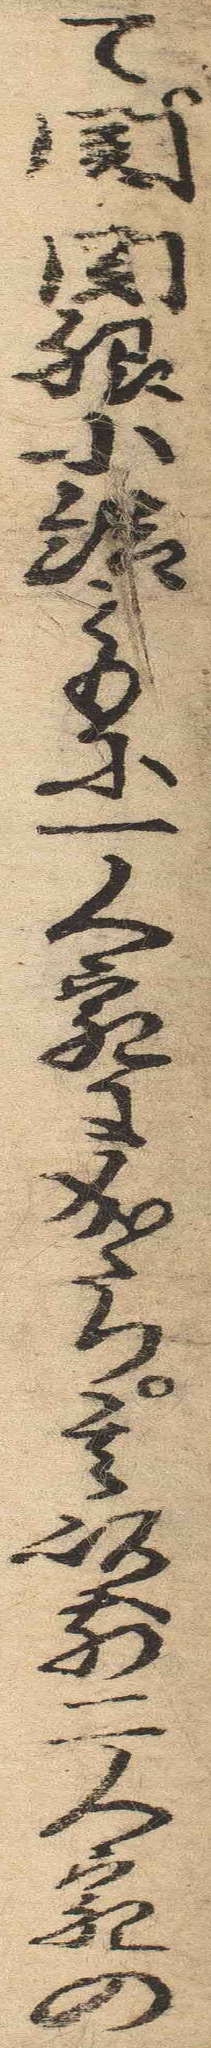て。関関脇小結ともに一人宛に成たり。其以前二人宛の
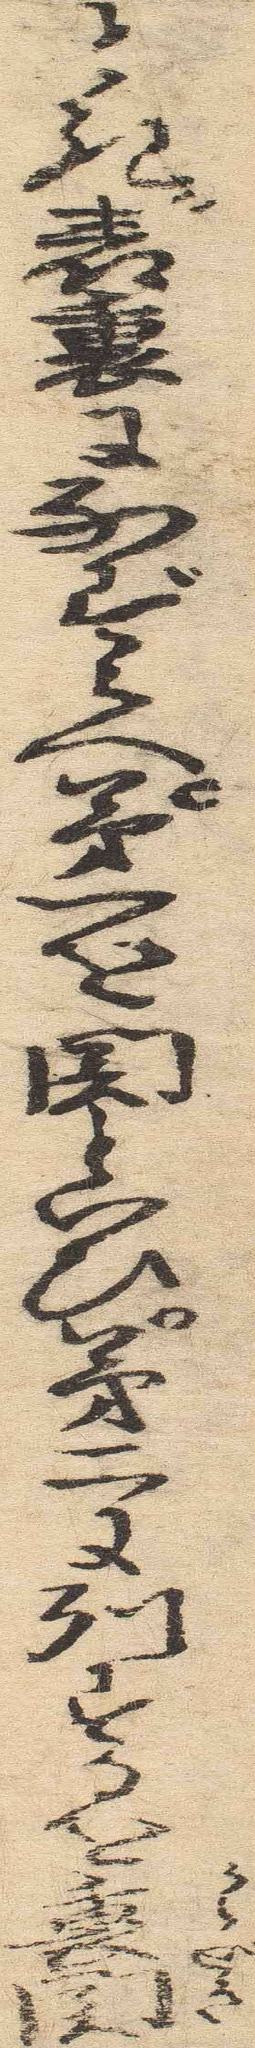とき。表裏になぞらへ。第一を関といひ。第二に列するを裏関
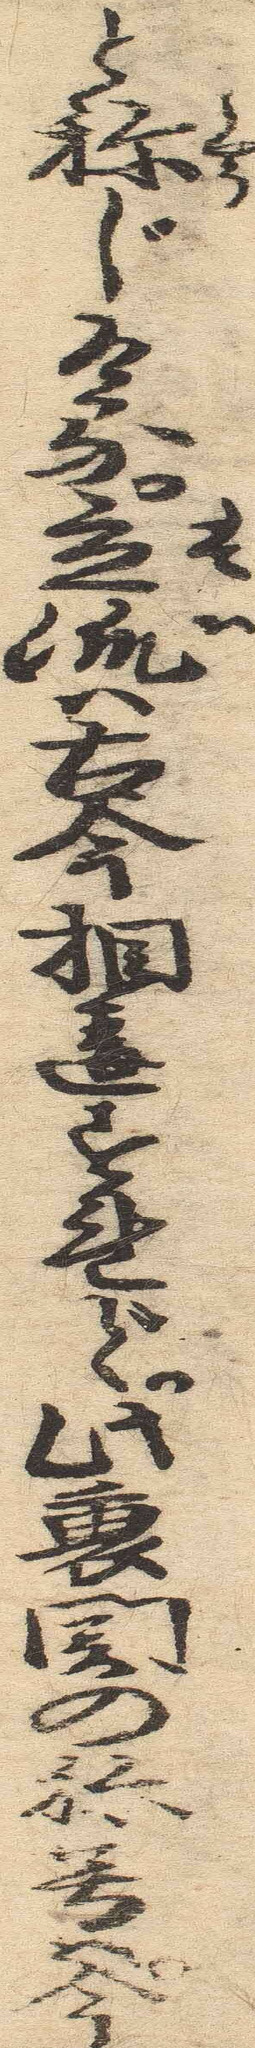と称じ有る。立派は古今相違すれど。此裏関の称号は。今
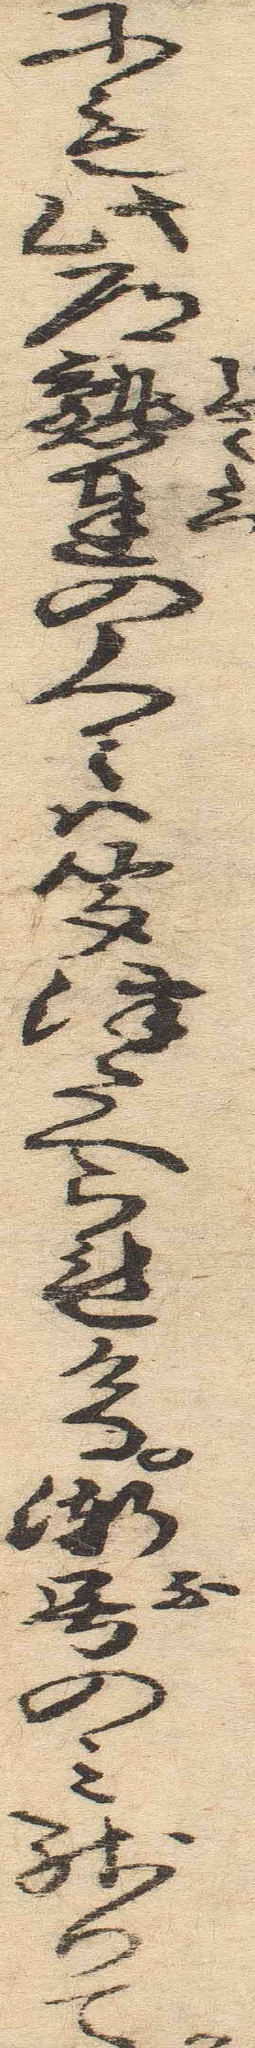にも此道熟達の人々は聞つたへられける。漸号のみ残りて。
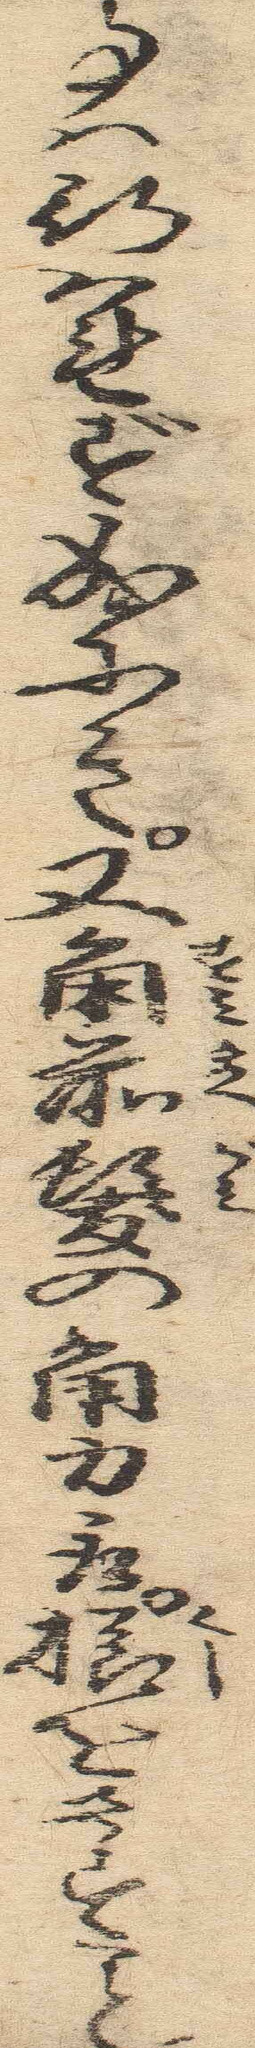事は行はれず成にき。又角前髪の角力取。櫛をさすこと
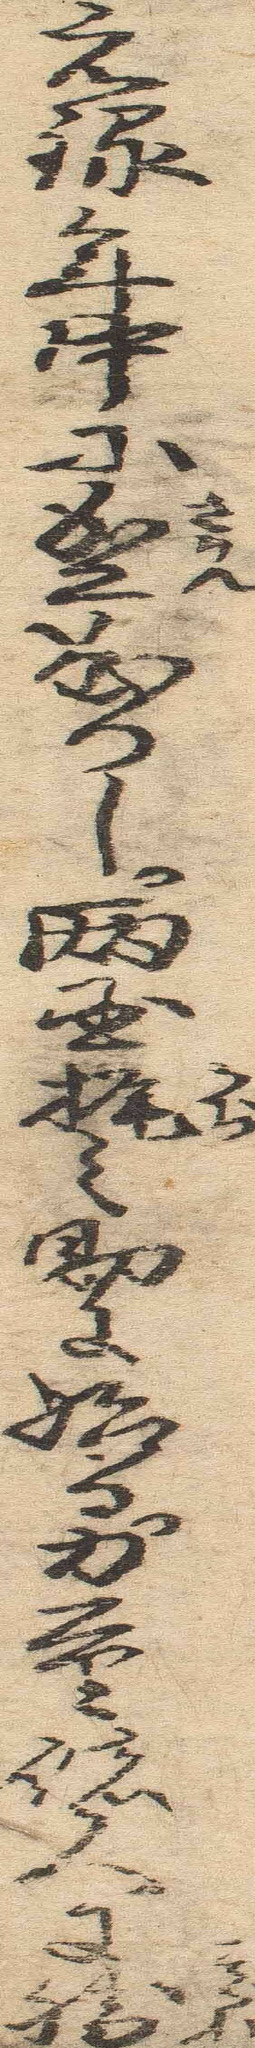元禄年中に盛成りし。両国梶之助に始る。力量諸人に勝
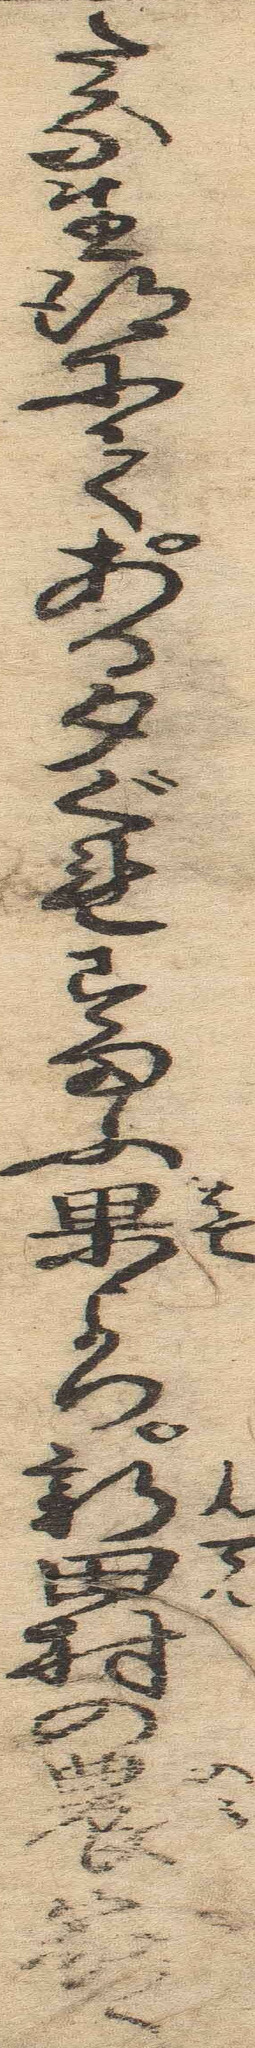たる生得にて。ある夕ぐれすまふ果より。新田村の農家へ
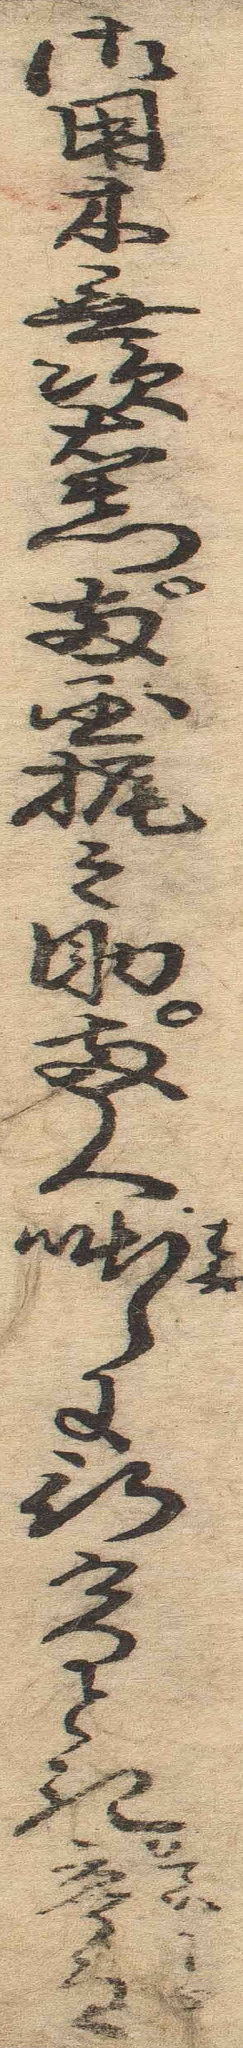御用木無次右衛門。両国梶之助。両人咄しに行けるとき。亭主
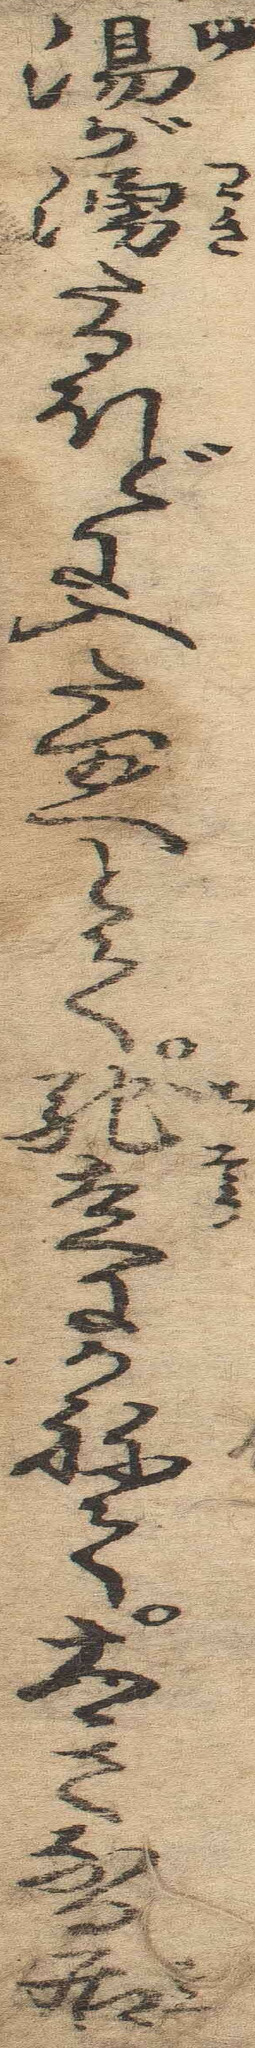湯が湧たるほどに入たまへとて。馳走にかねて。大きなる居

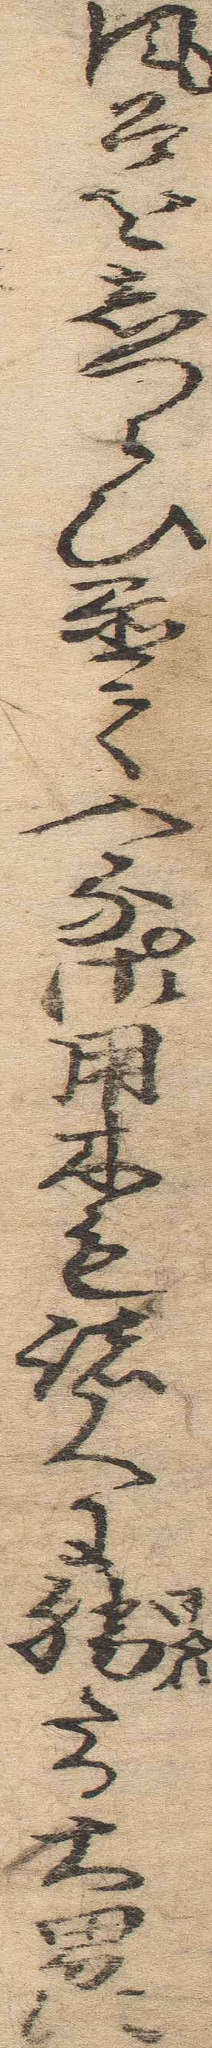風呂をしつらひ置て入る。御用木も諸人に勝たる大男に
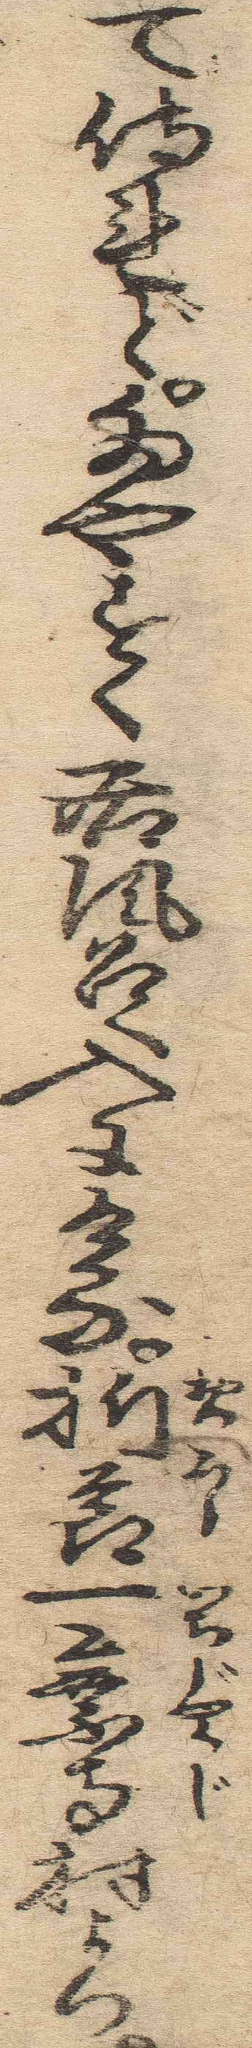て侍れど。たやすく居風呂へ入にける。折節一乗寺村より。
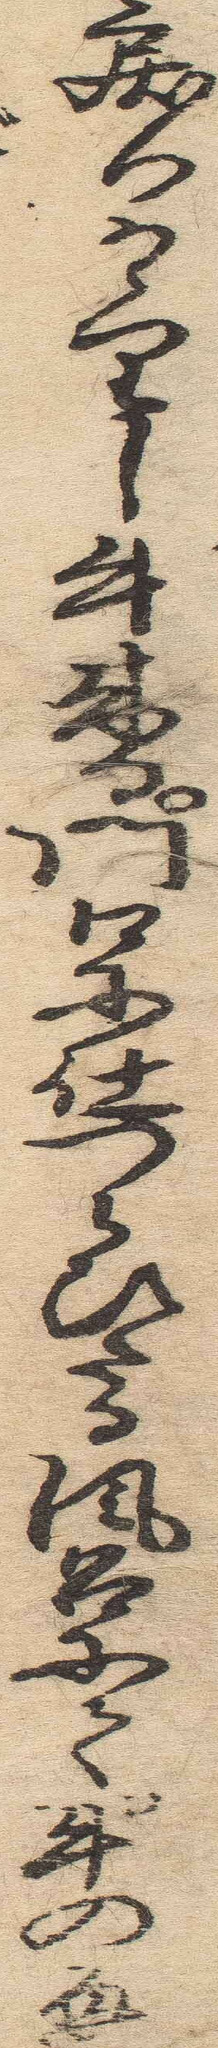戻りたりし牛来る。門口に仕つらひたる風呂にて。牛の通
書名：古今相撲大全
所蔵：東京学芸大学附属図書館 国文学研究資料館
